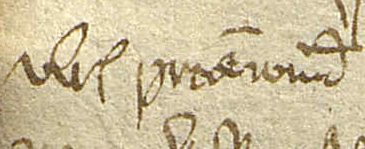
vlr* %%%%%%d*
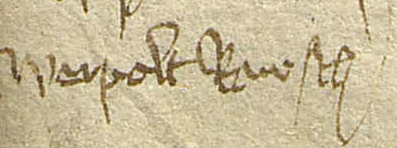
Werpolt Rawſch*
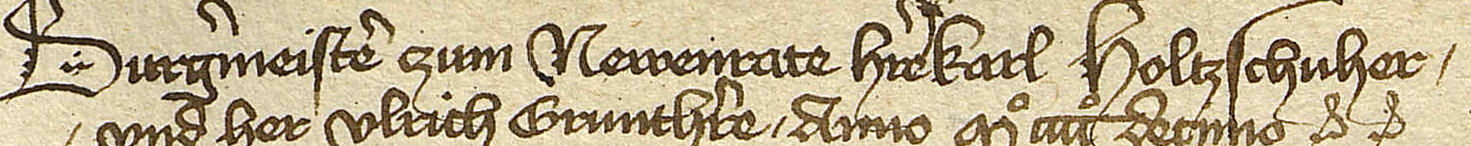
Burg*meiſte* cʒum Newenrate hre* karl Holtʒſchuher /
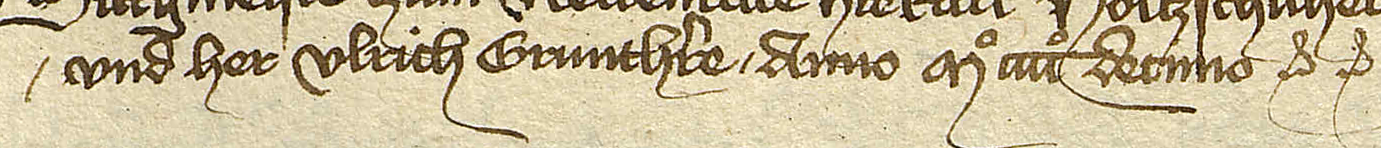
/ vnd her vlrich Grunthre* / Anno M* cccc* decimo § §
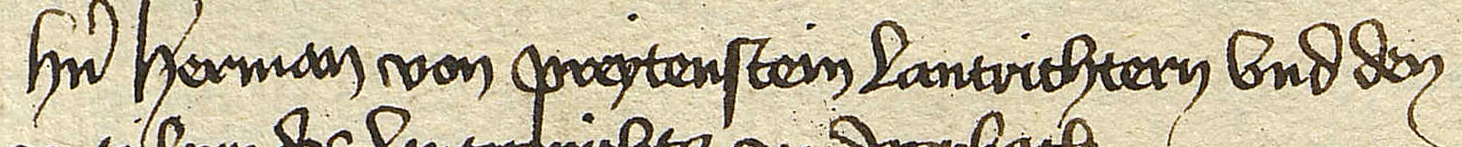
hn* herman von Preytenſtein lantrichtern vnd den
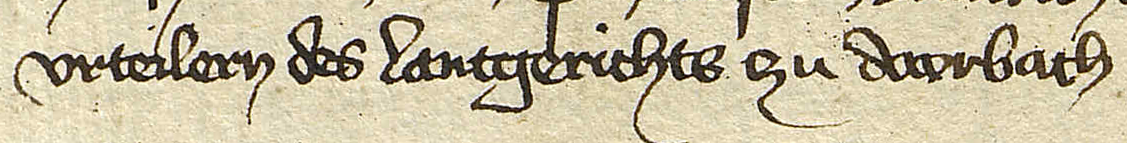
vrteilern des lantgerichts cʒu Awrbach
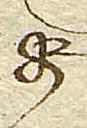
%
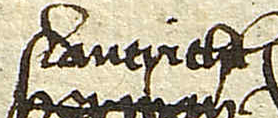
lantricht*
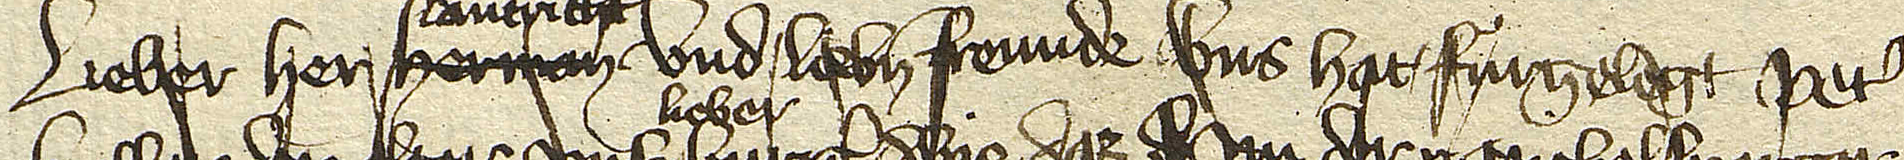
Lieber her herman / Vnd liebn* freunde / Vns hat fürgelegt Pet*
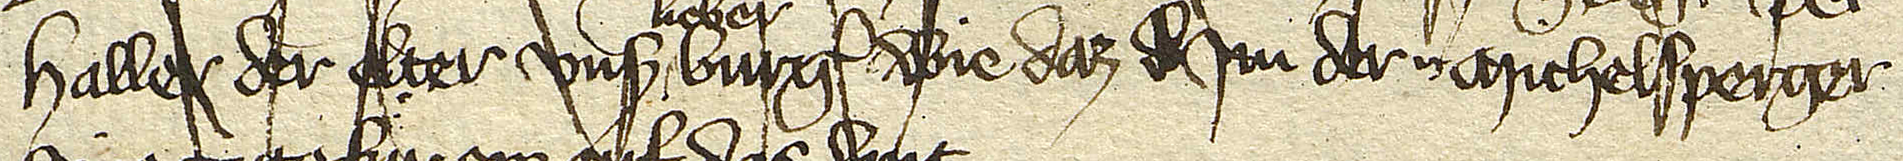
haller der elter vnſ* burg* / wie daʒ d Im der ~ Michelſperger
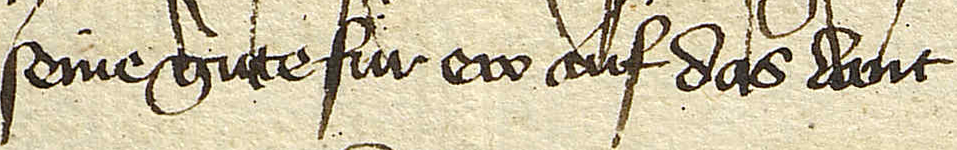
ſeine gute für ew auf das lant
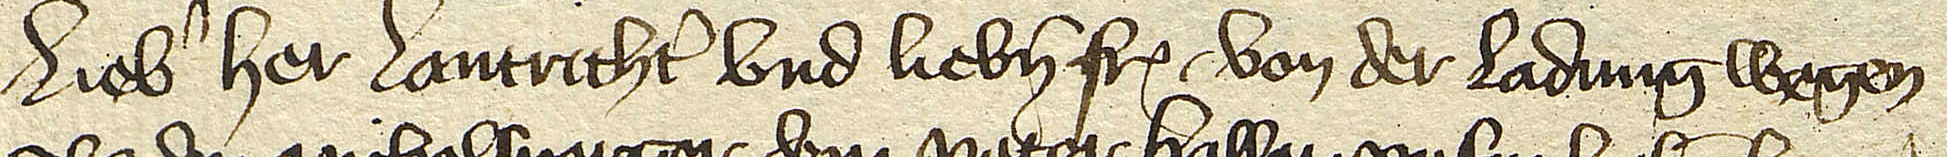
Lieb* her lantricht* vnd liebn* fr* / von der ladung wegen
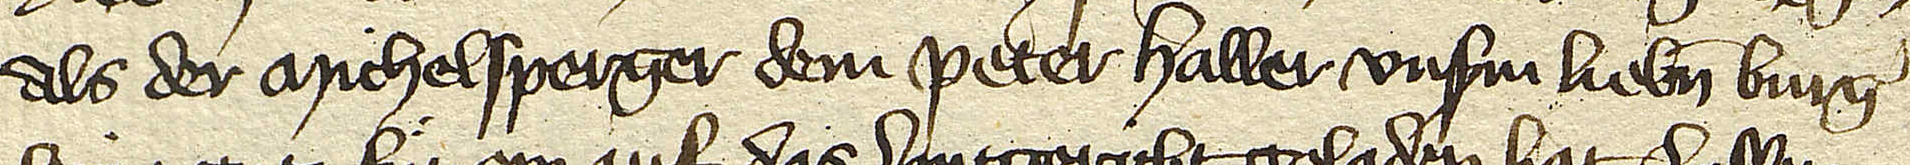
Als der Michelſperger dem Peter haller vnſ*m liebn* burg*
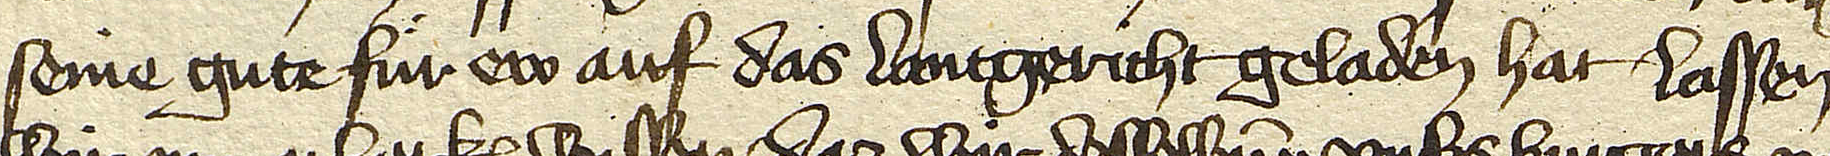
ſeine gute für ew auf das lantgericht geladen hat / laſſen
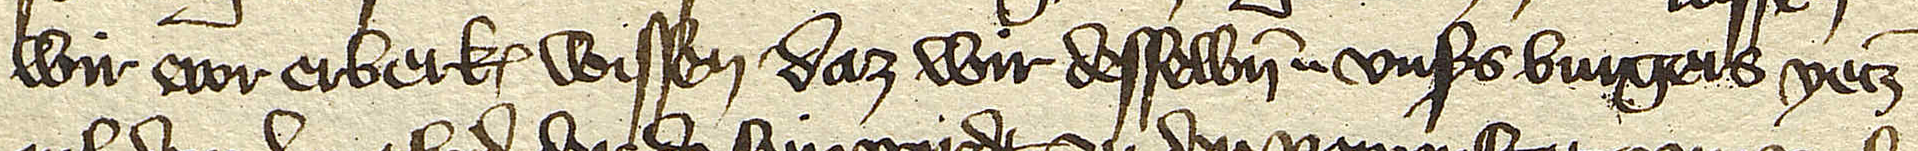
wir ewr erberk* wiſſen / daʒ wir deſſelbn* ~ vnſ*s burgers yecʒ*
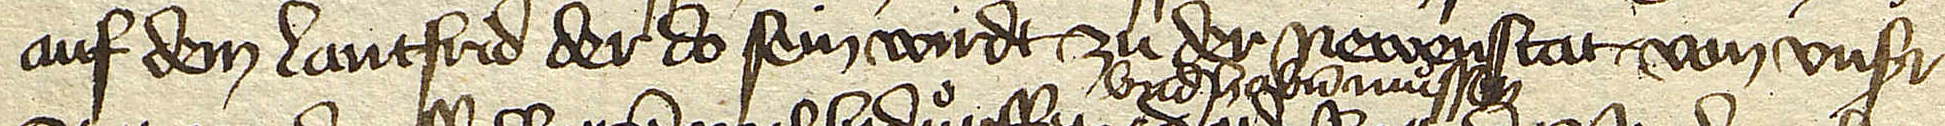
auf dem lantfrid der do ſein wirdt cʒu der Newenſtat / von vnſ*r
